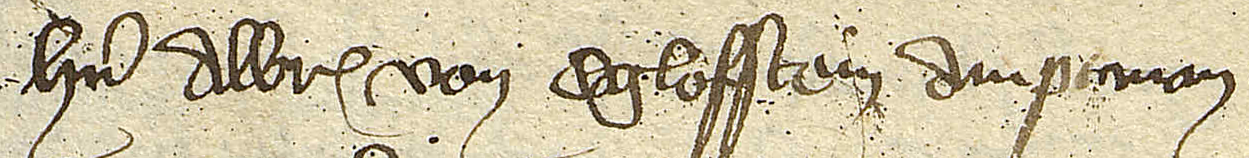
hn* Albr* von Eglofſtein Amptman
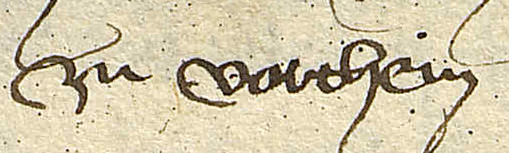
cʒu vorcheim
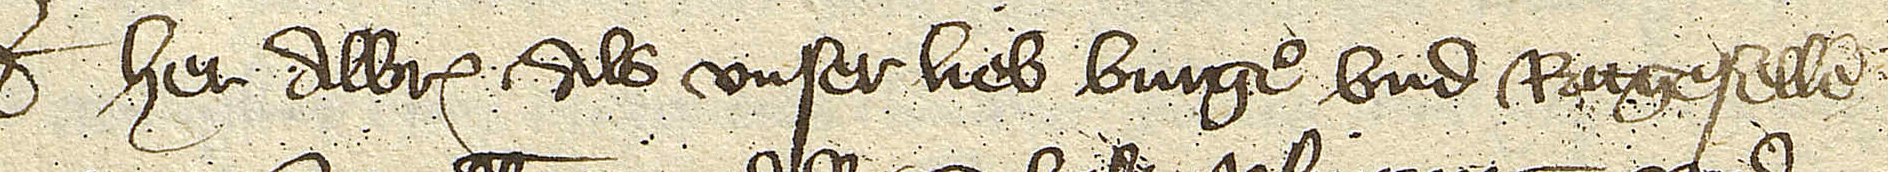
L* her Albr* / Als vnſer lieb burge* vnd Ratgeſelle*
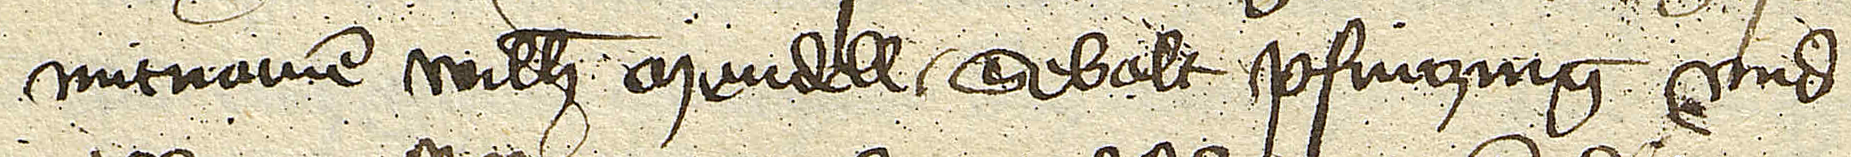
mitname* wilh* Mendell / Sebolt pfincʒing vnd
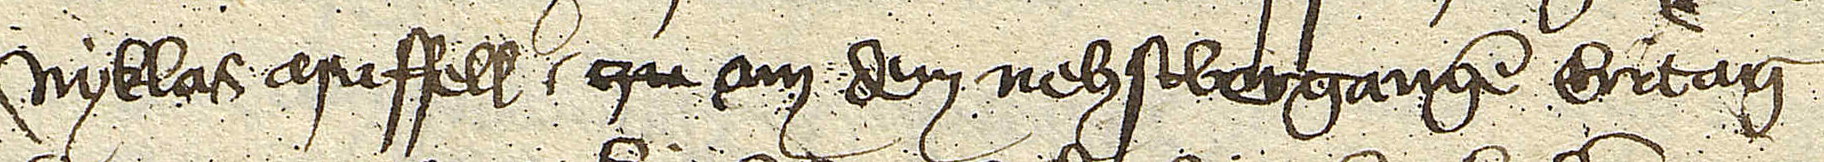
Nyclas Muffell / cʒu am dem nehſtvergange* Eritag
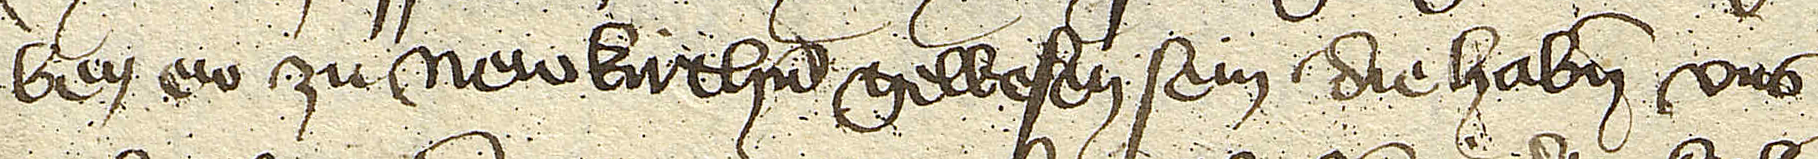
bey ew cʒu Newkirchn* geweſen ſein / die habn* vns
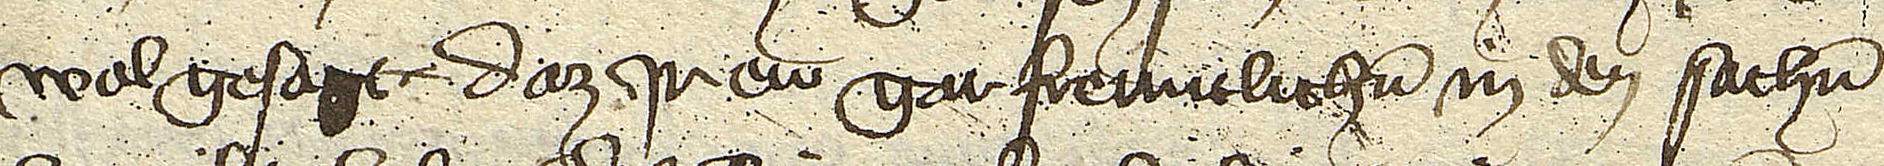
wol geſagt / daʒ Ir ew gar freuntlichn* in den ſachn*
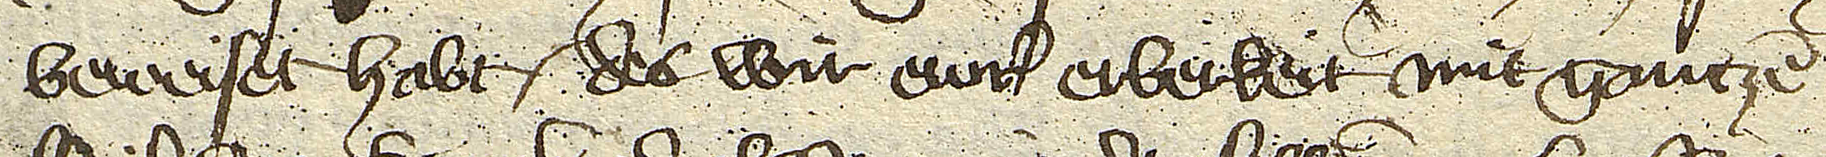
beweiſet habt / des wir ewr* erberkeit mit gancʒe*
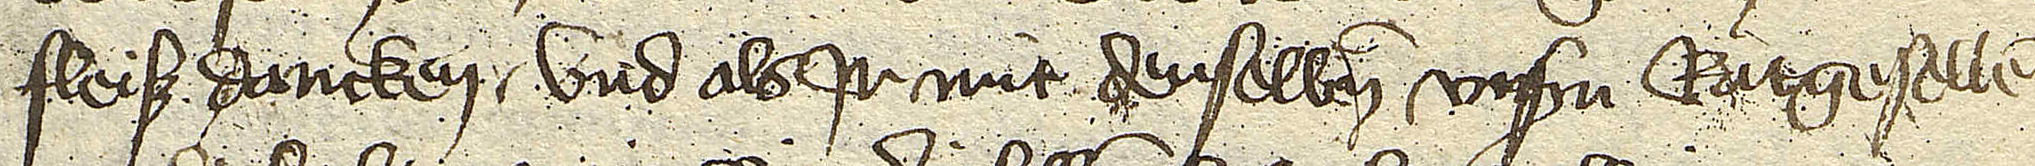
fleiſʒ dancken / vnd als Ir mit denſelbn* vnſ*n Ratgeſelle*
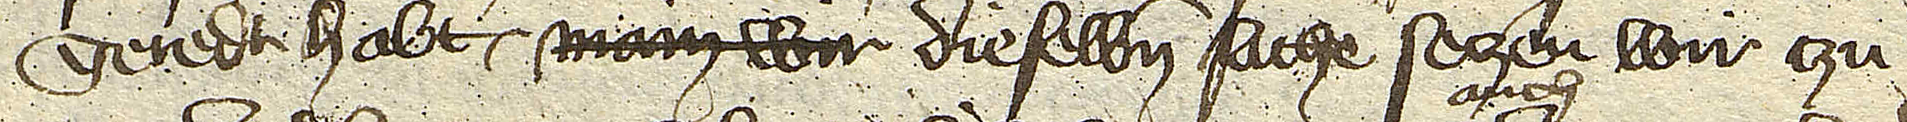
geredt habt / main wir dieſelbn* ſache ſecʒen wir cʒu
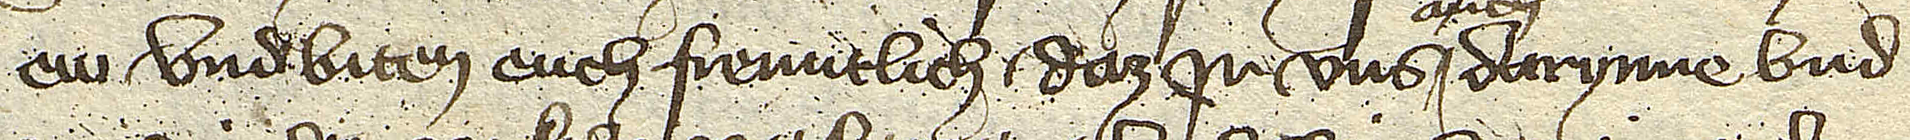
ew / vnd biten euch freuntlich / daʒ Ir vns darynne vnd
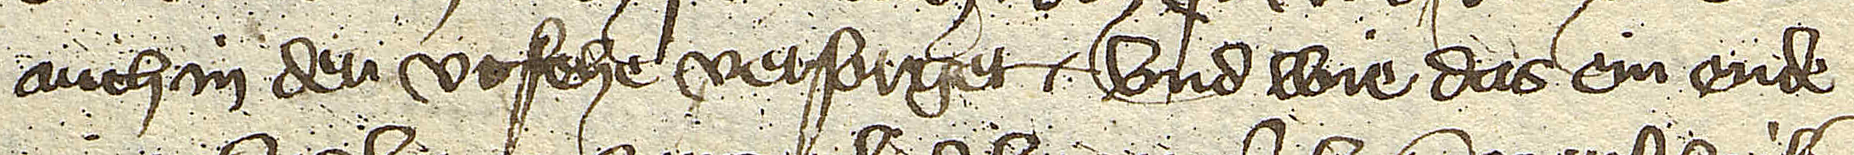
auch in den vrfehe verſorget / vnd wie das ein ende
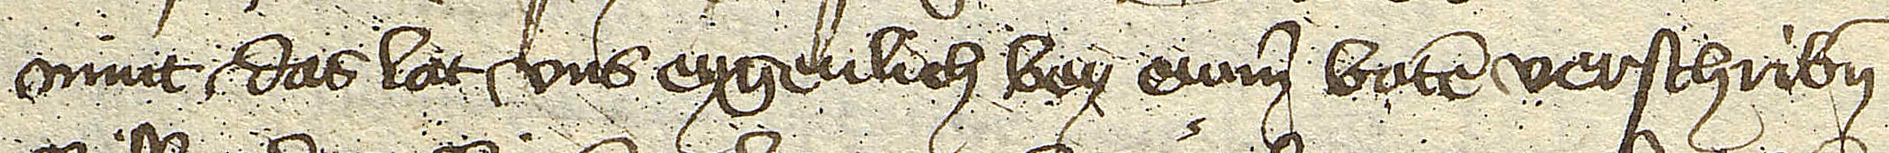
nimt / das lat vns eygenlich bey ewm* bote* verſchribn*
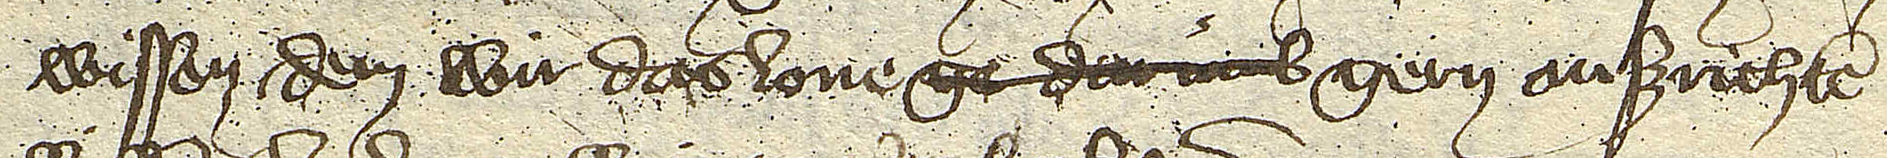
wiſſen / dem wir das lone ge darümb gern auſʒrichte*
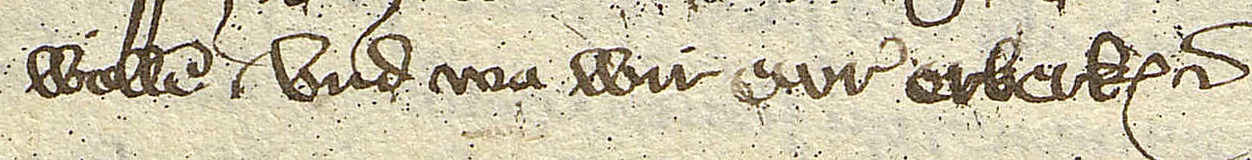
wölle* / vnd wo wir ewr* erberk* ec*
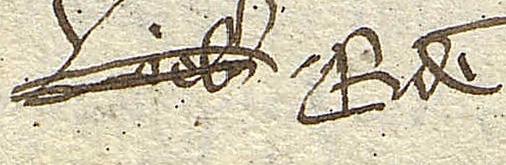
Lieb* Eide*
